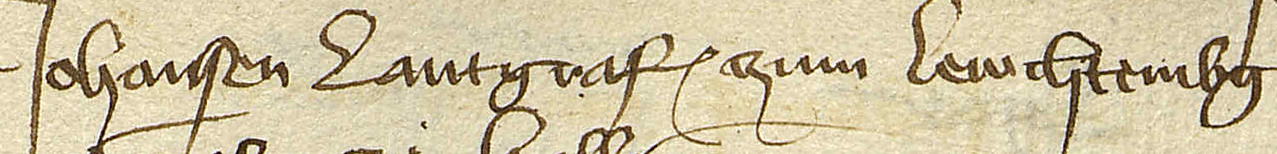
Iohanſen Lantgraf* cʒum lewchtemb*g
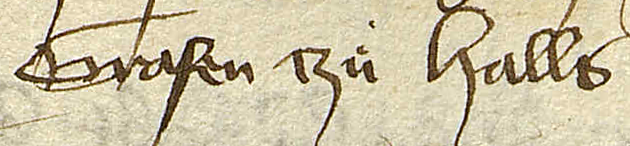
Grafen cʒü Halls
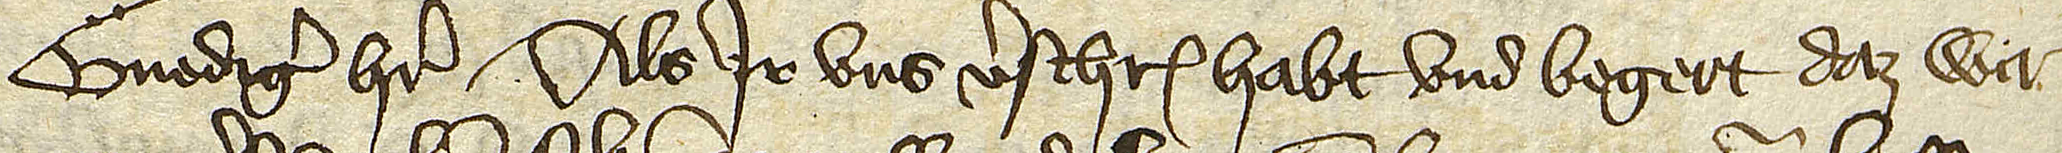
Gnedig* hr* / Als Ir vns v*ſchr* habt vnd begert daʒ wir
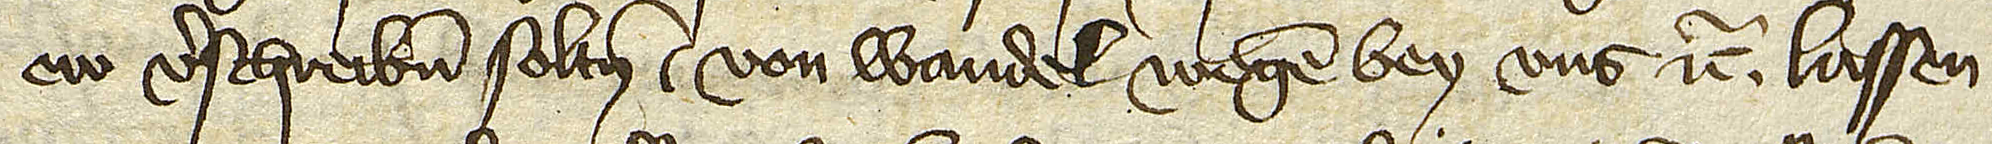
ew v*ſchreibn* ſoltn* / von wandel wege* bey vns ec*. laſſen
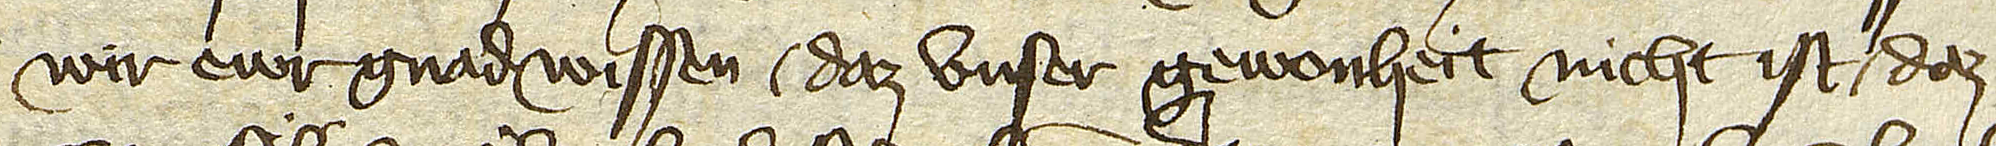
wir ewr gnad wiſſen / daʒ vnſer gewonheit nicht iſt / daʒ
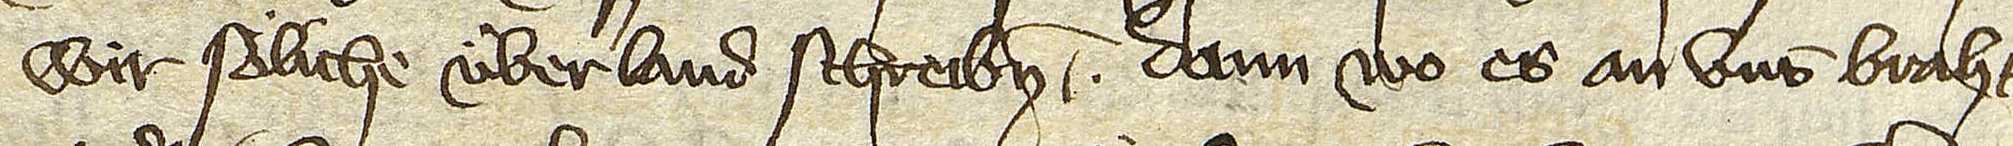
wir ſöliche v̈ber land ſchreibn* / . dann wo es an vns braht
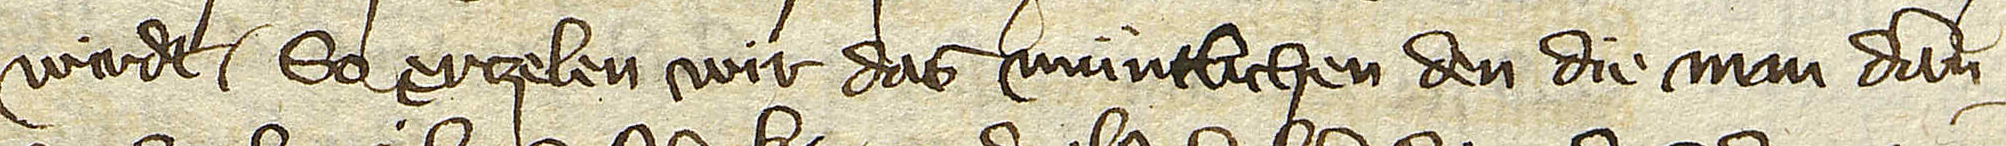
wirdt / So ercʒelen wir das müntlichen den die man dan*
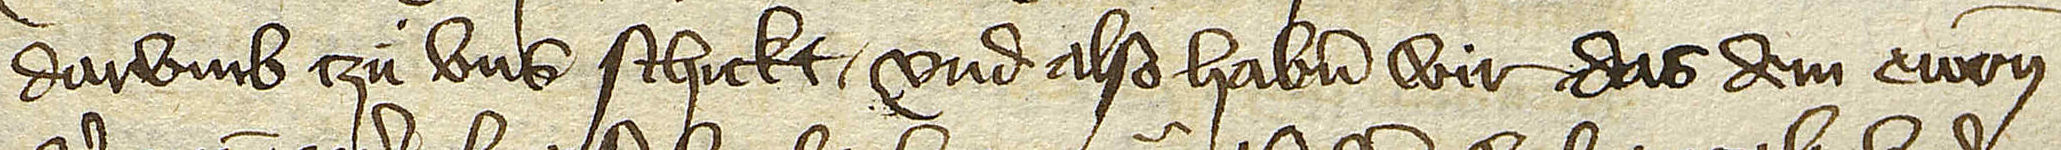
darvmb cʒü vns ſchickt / vnd alſo habn* wir / das dem ewrn*
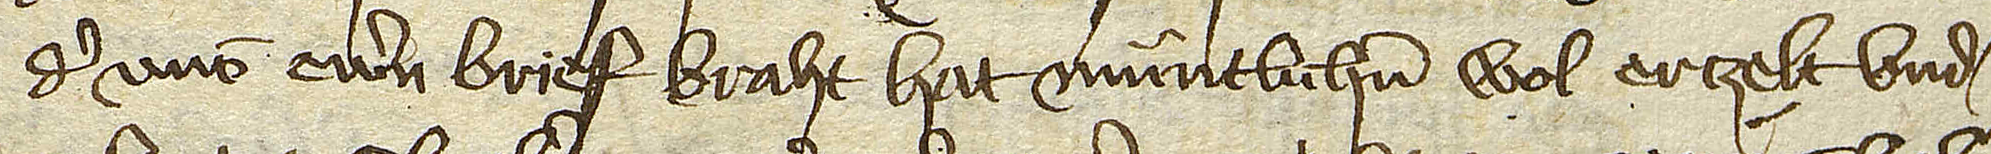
d* vns ew*n brief braht hat müntlichn* wol ercʒelt vnd
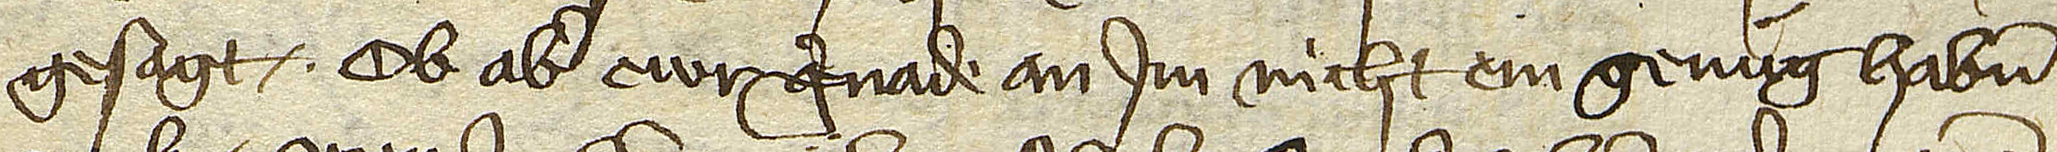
geſagt / . Ob ab* ewr gnade an Im nicht ein genüg habn*
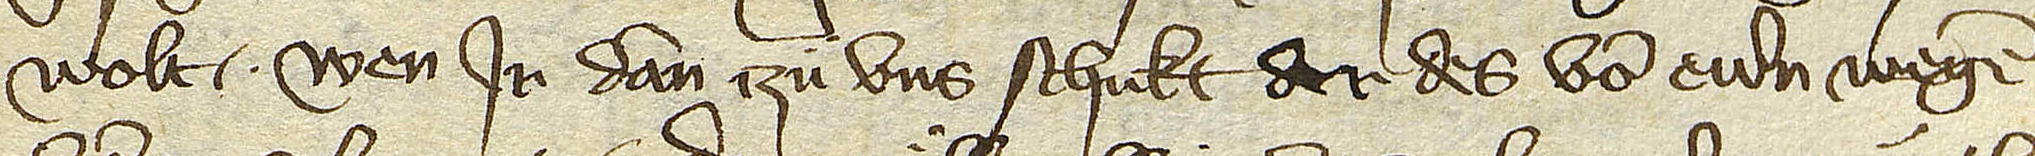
wolt / . wen Ir dan* cʒu vns ſchickt der des vo* ew*n wege*
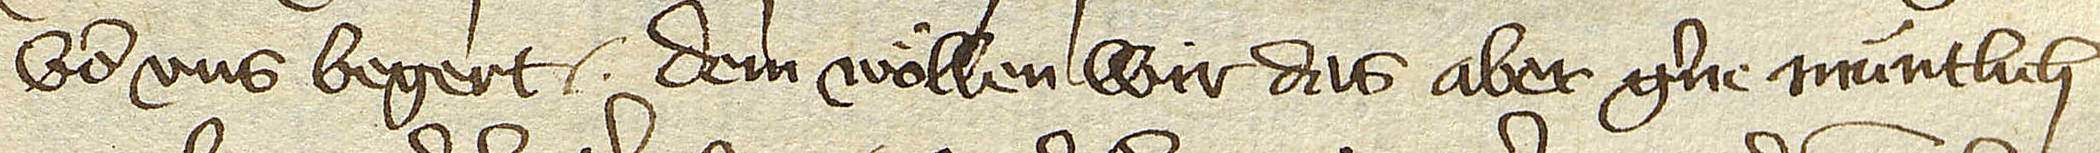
vo* vns begert / . dem wöllen wir das aber g*ne müntlich
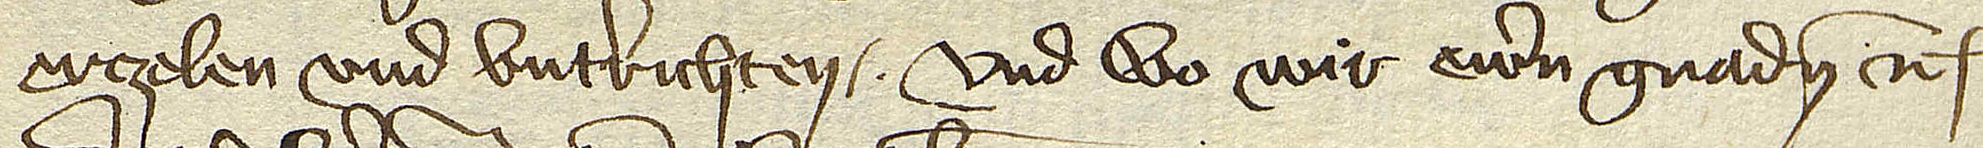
ercʒelen vnd vnt*richtn / . vnd wo wir ew*n gnadn* ec*
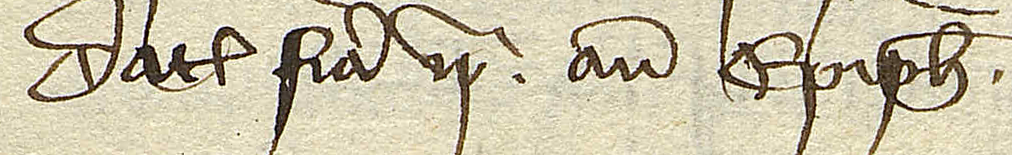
Dat* fia* ii* . an* Epiph* .
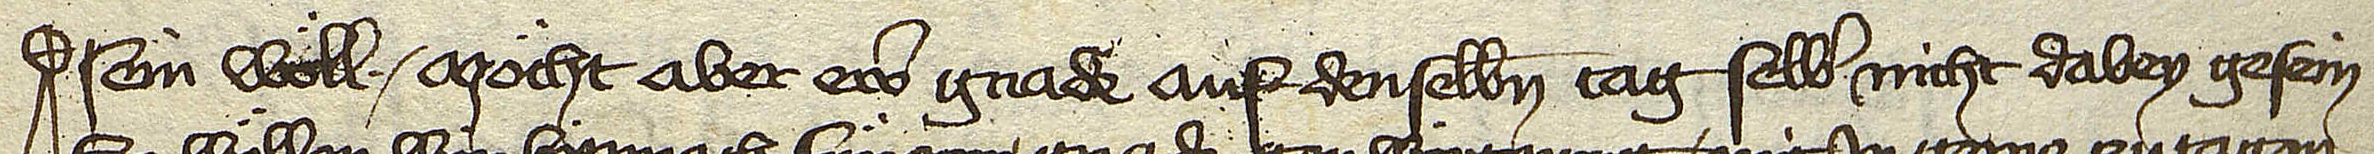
ſein wöll . / Möcht aber ew* gnade auf denſelbn* tag ſelb* nicht dabey geſein
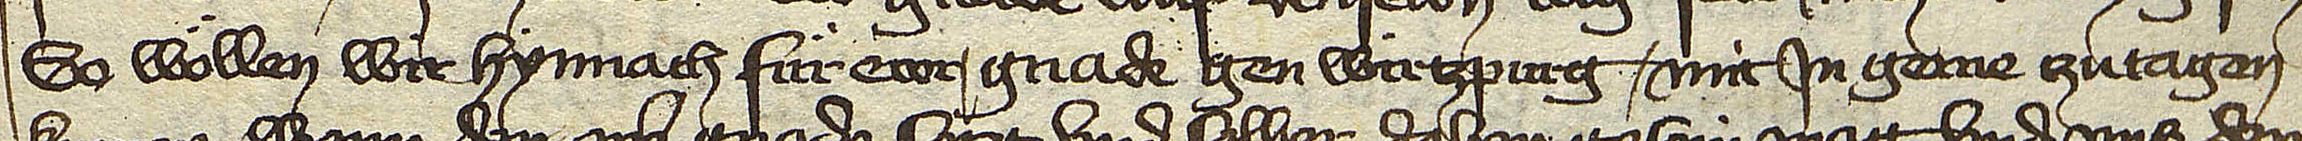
So wöllen wir hynnach für ewr / gnade gen wircʒpurg / mit In gerne cʒutagen
